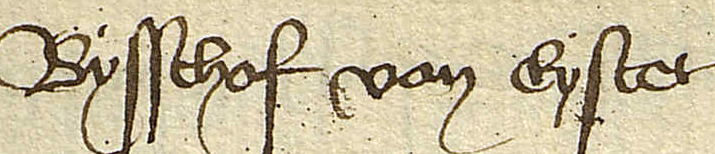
Byſſchof von Eyſtet
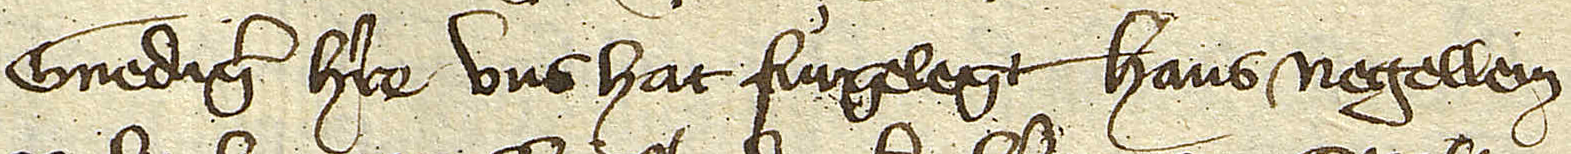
Gnedig* h*re vns hat fürgelegt hans negellein
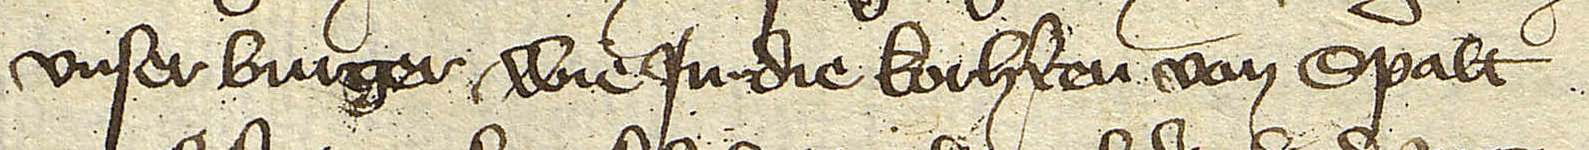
vnſer burger / wie In ~ die korh*ren von Spalt
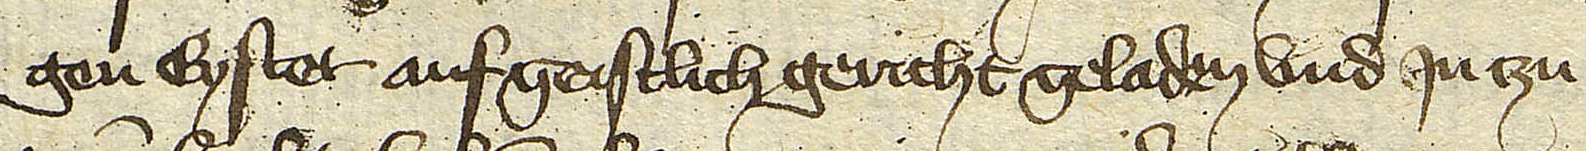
gen Eyſtet auf geiſtlich gericht geladen vnd In cʒu
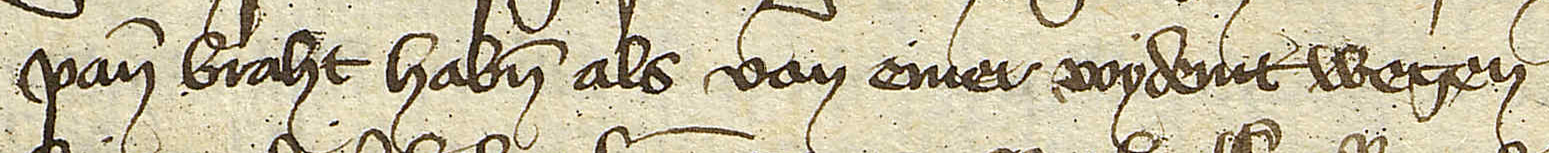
pan* braht habn* als von einer wydemt wegen
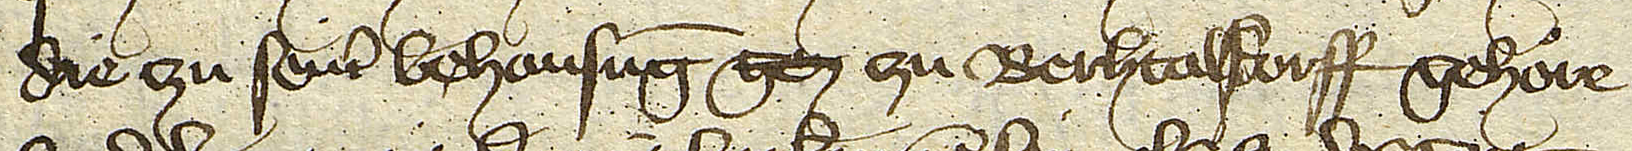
die cʒu ſein* behauſug* gen cʒu Berhtolſdorff gehöre
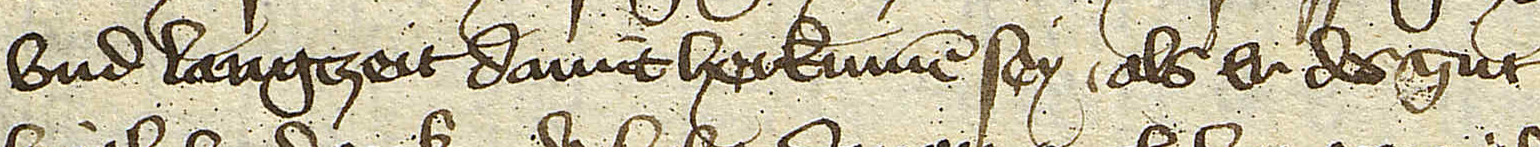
vnd langcʒeit damit herkume* ſey / als Er des gut
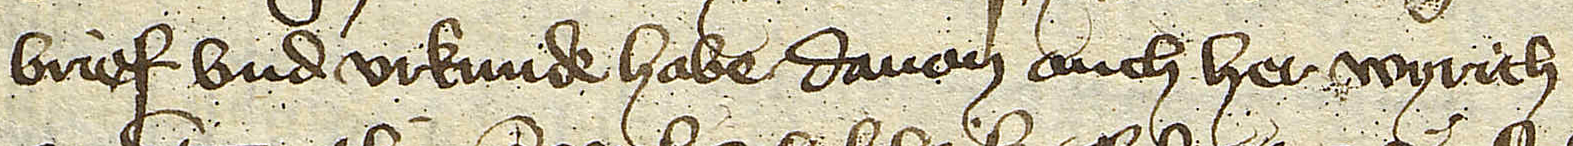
brief vnd vrkunde habe / dauon auch her wyrich
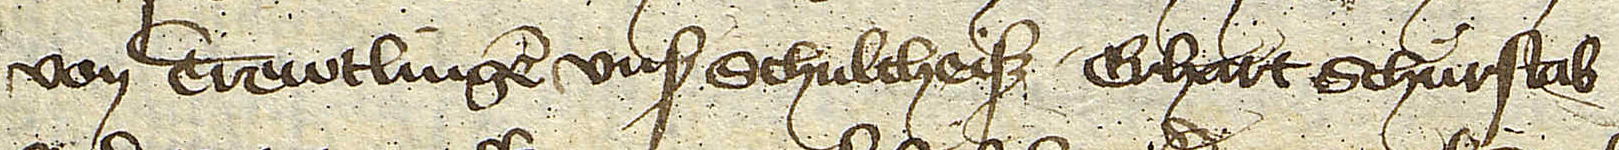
von Trewtlinge* vnſ* Schultheiſʒ / Erhart Schürſtab
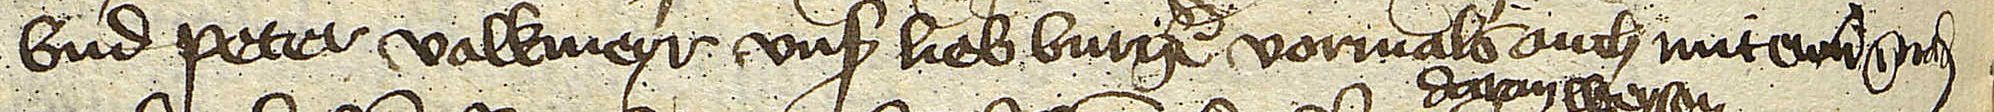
vnd Peter volkmeyr vnſ* lieb burge* vormals auch mit ewn* gnad*
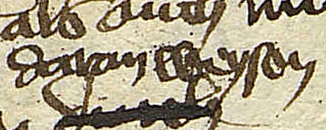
daran weyſen
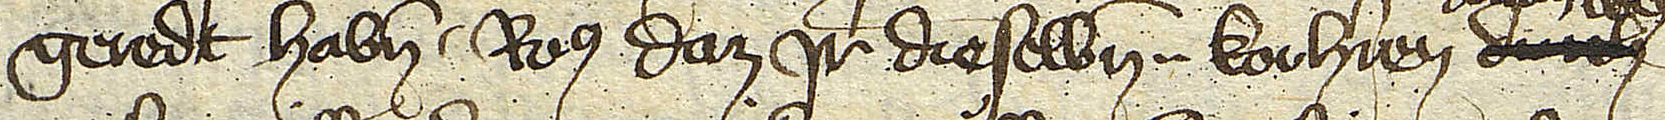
geredt habn* / Ro* daʒ Ir dieſelbn* ~ korh*ren durch
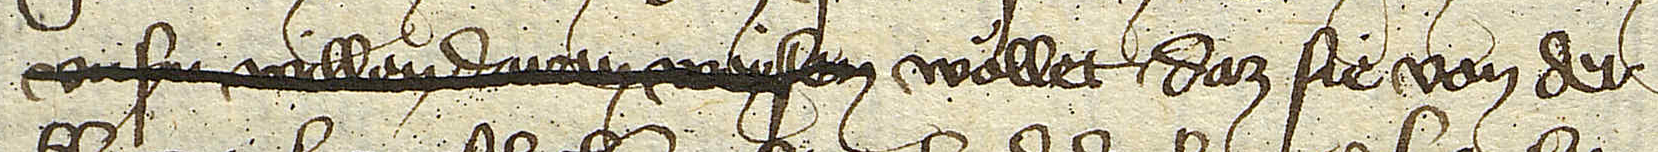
vnſ*n willen daran weyſen wöllet / daʒ ſie von der
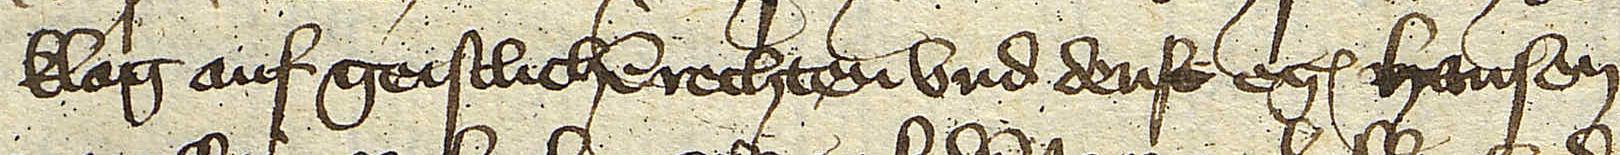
klag auf geiſtliche* rechten vnd denſe eg* Hanſen
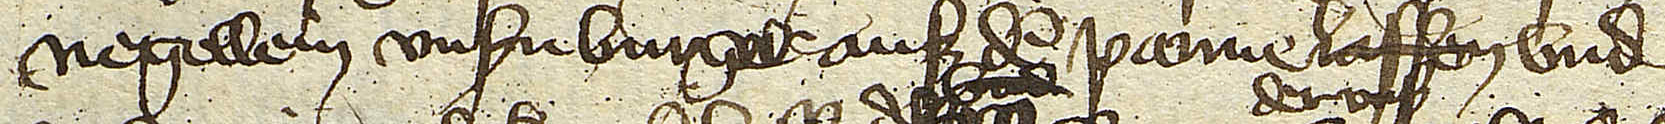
negellein vnſ*n burger auſʒ d* panne laſſen vnd
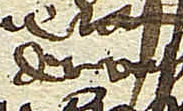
der vnſ*
